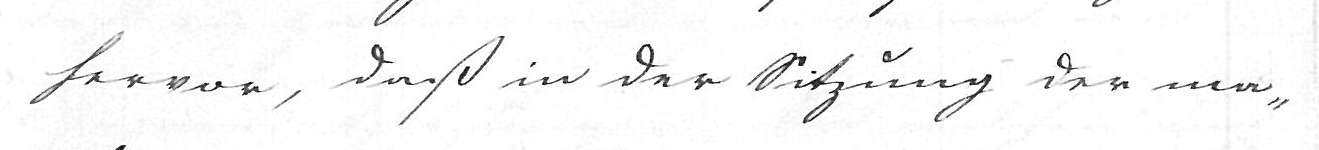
hervor, daß in der Sitzung der ma-
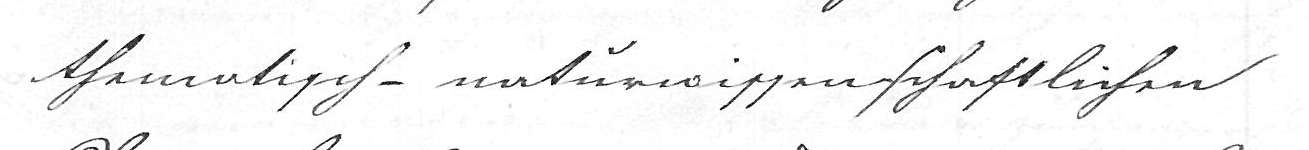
thematisch-naturwissenschaftlichen
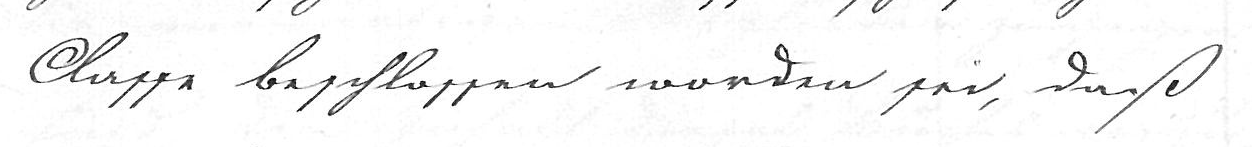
Classe beschlossen worden sei, daß
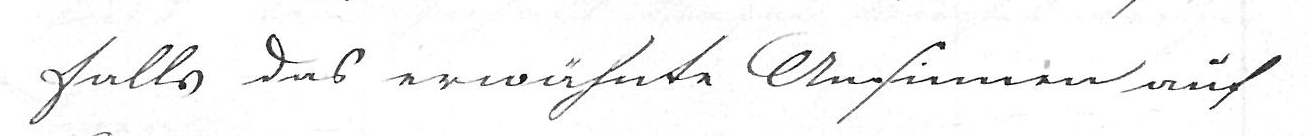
falls das erwähnte Ansinnen auf
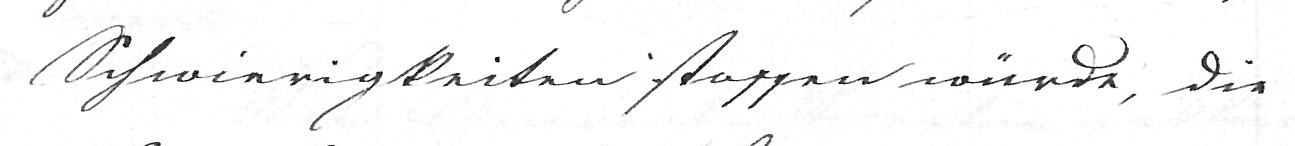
Schwierigkeiten stossen würde, die
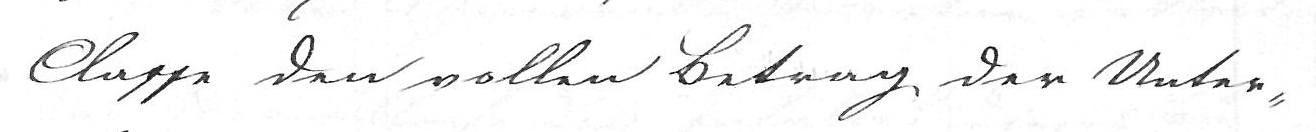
Classe den vollen Betrag der Unter-
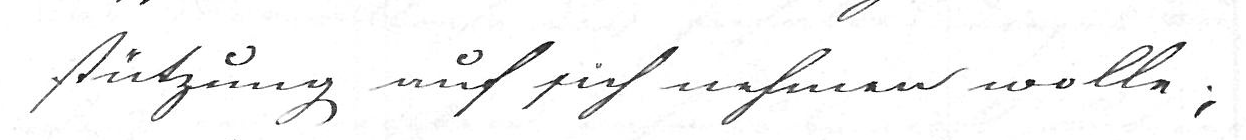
stützung auf sich nehmen wolle;
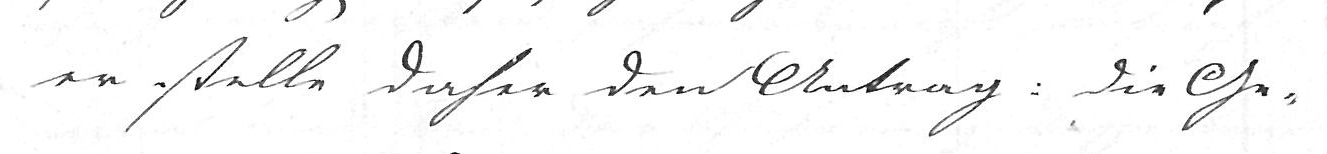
er stelle daher den Antrag: Die Ge-
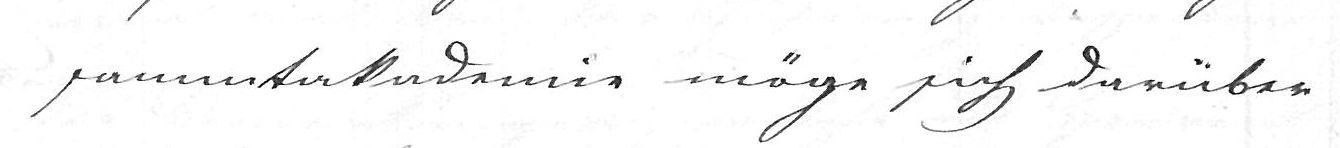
sammtakademie möge sich darüber
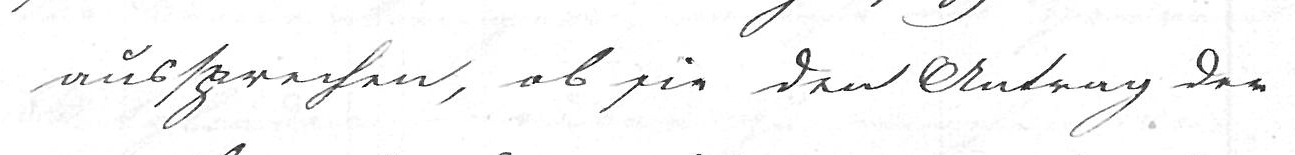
aussprechen, ob sie den Antrag der
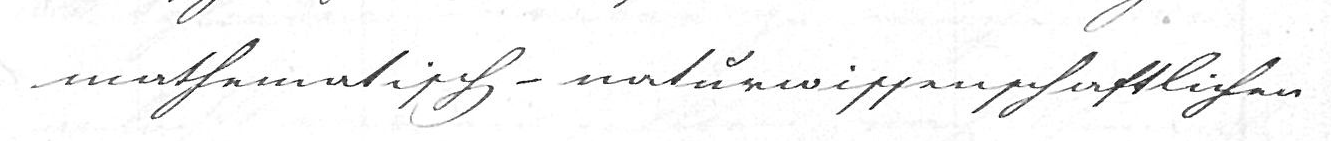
mathematisch-naturwissenschaftlichen
